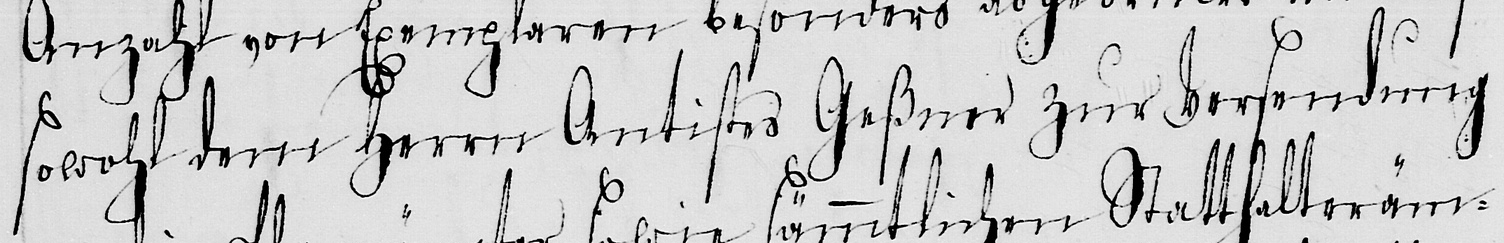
sowohl dem Herrn Antistes Geßner zur Versendung
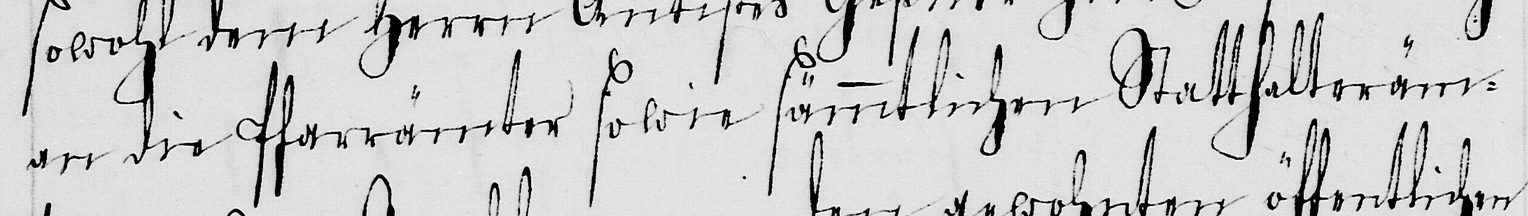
an die Pfarrämter sowie sämmtlichen Statthalteräm¬
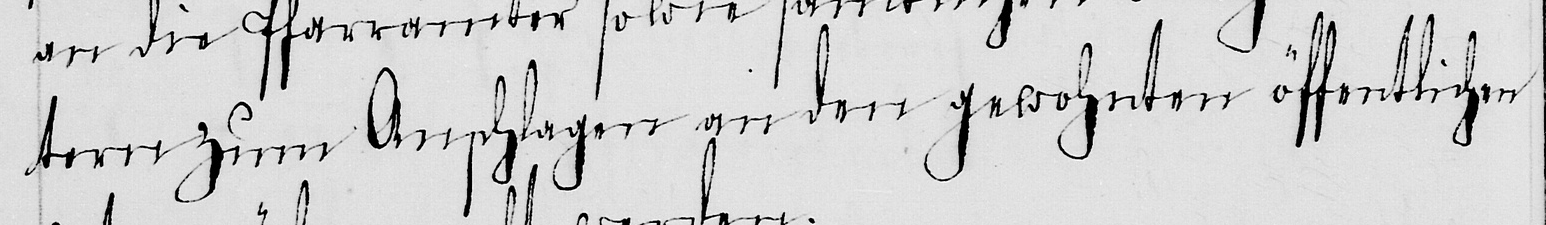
tern zum Anschlagen an den gewohnten öffentlichen
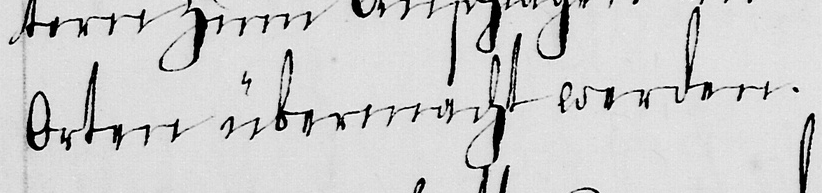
Orten übermacht werden.
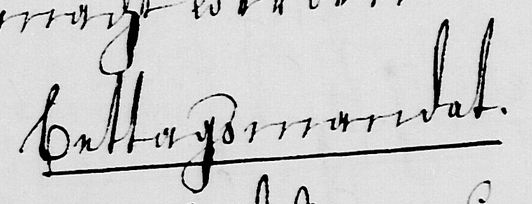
Bettagsmandat.
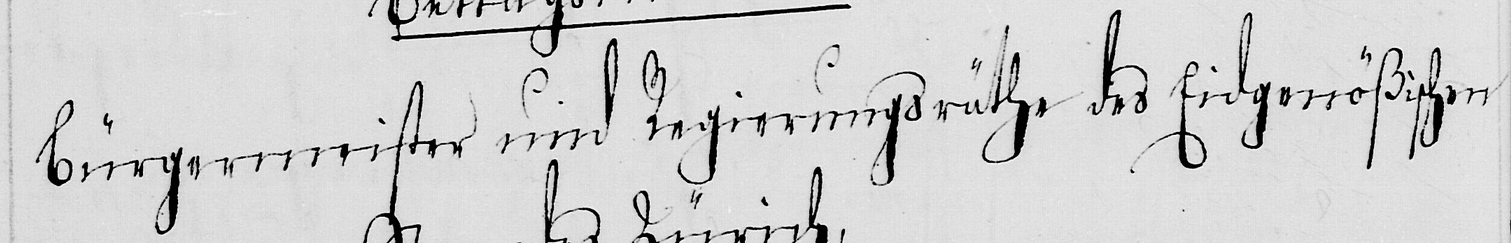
Bürgermeister und Regierungsräthe des Eidgenößischen
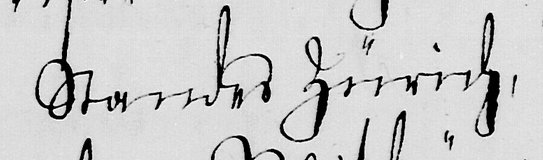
Standes Zürich,
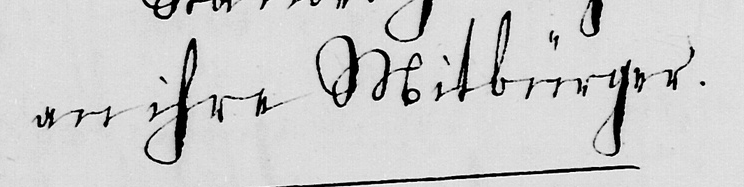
an ihre Mitbürger.
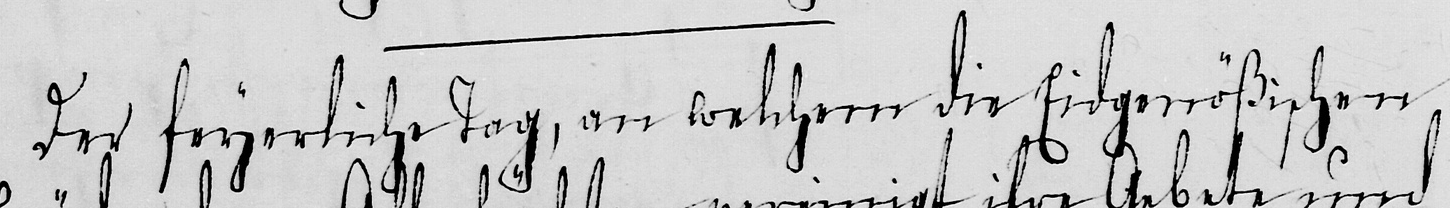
Der feyerliche Tag, an welchem die Eidgenößischen
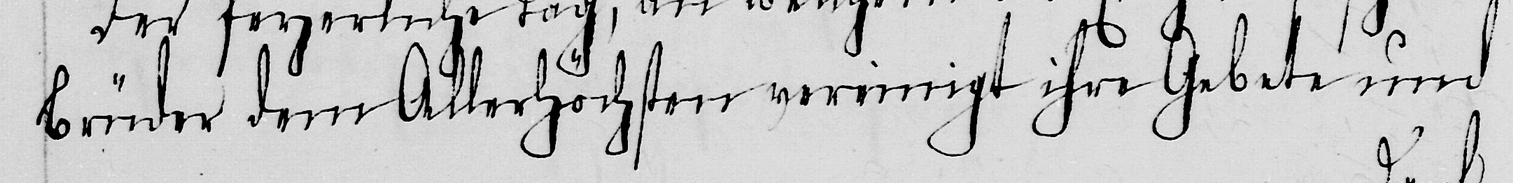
Brüder dem Allerhöchsten vereinigt ihre Gebete und
